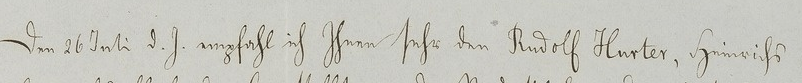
Den 26 Juli d. J. empfahl ich Ihnen sehr den Rudolf Hurter, Heinrichs
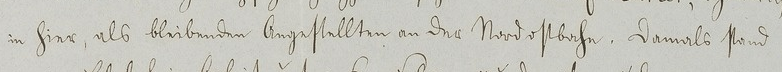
in hier, als bleibenden Angestellten an der Nordostbahn. Damals stand
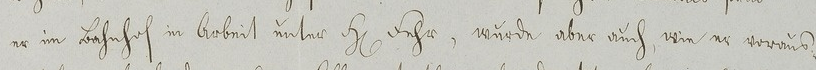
er im Bahnhof in Arbeit unter Herrn Fehr, wurde aber auch, wie er voraus-
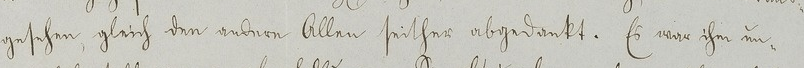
gesehen, gleich den andern Allen seither abgedankt. Es war ihm un-
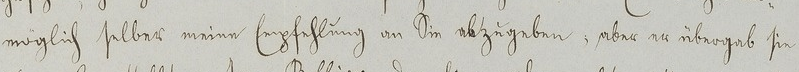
möglich selber meine Empfehlung an Sie abzugeben; aber er übergab sie
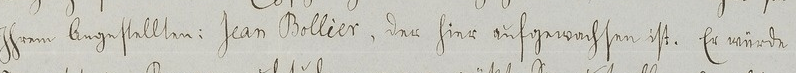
Ihrem Angestellten: Jean Bollier, der hier aufgewachsen ist. Er würde
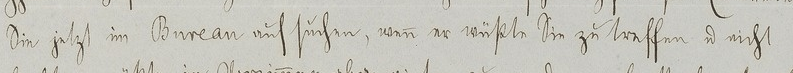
Sie jetzt im Bureau aufsuchen, wenn er wüßte Sie zu treffen & nicht
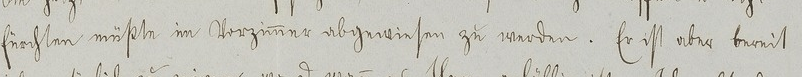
fürchten müßte im Vorzimmer abgewiesen zu werden. Er ist aber bereit
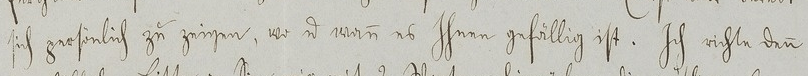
sich persönlich zu zeigen, wo & wann es Ihnen gefällig ist. Ich richte denn
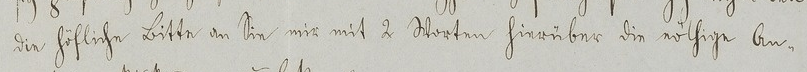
die höfliche Bitte an Sie mir mit 2 Worten hierüber die nöthige An-
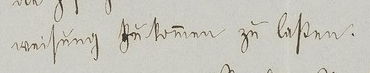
weisung zukommen zu laßen.
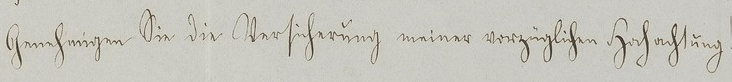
Genehmigen Sie die Versicherung meiner vorzüglichen Hochachtung!
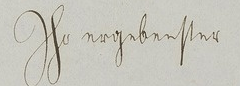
Ihr ergebenster
